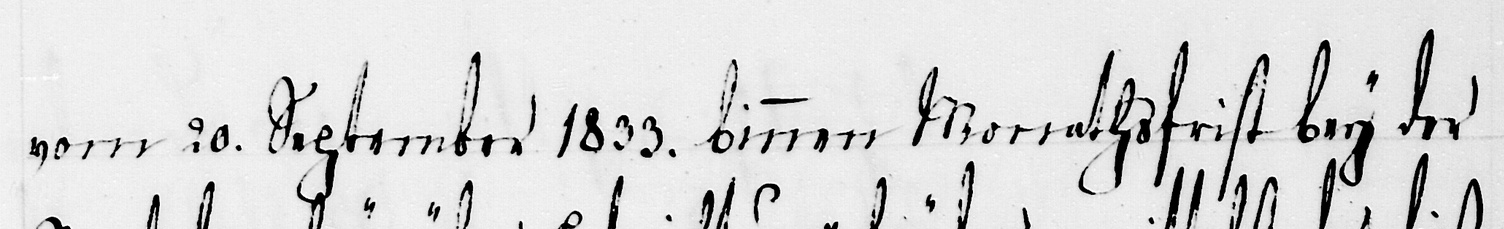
vom 20. September 1833. binnen Monathsfrist bey der
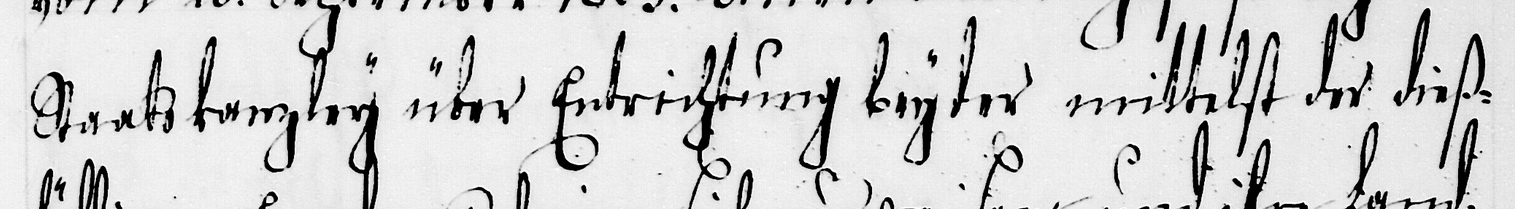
Staatskanzley über Entrichtung beyder mittelst der dieß¬
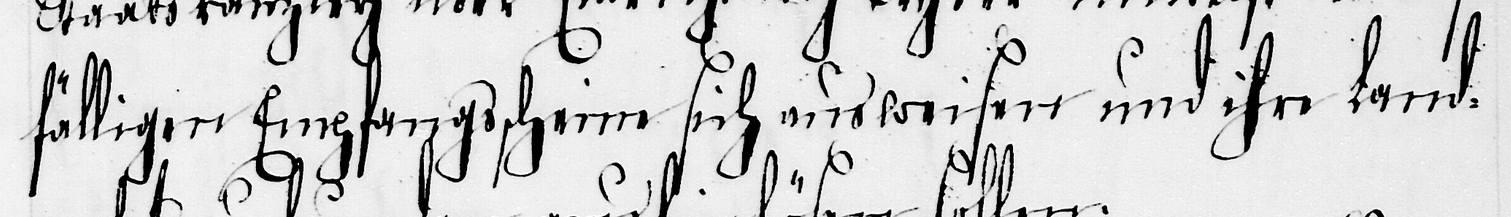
fälligen Empfangsscheine sich ausweisen und ihre Land¬
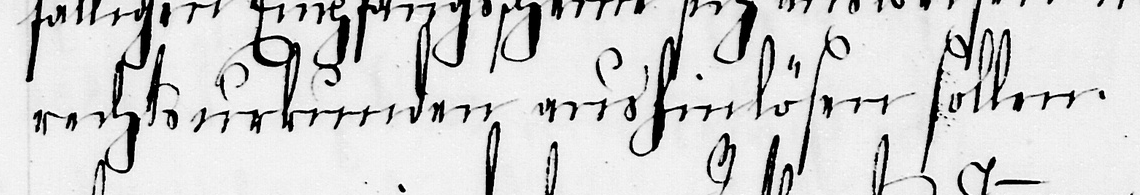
rechtsurkunden aushinlösen sollen.
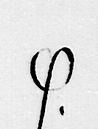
M.
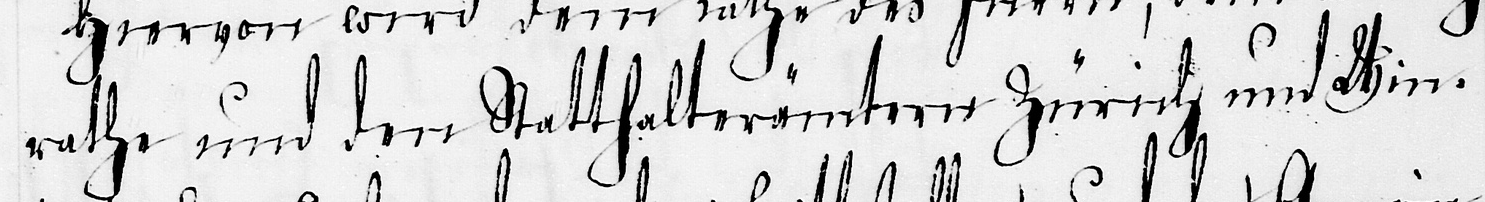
rathe und den Statthalterämtern Zürich und Win¬
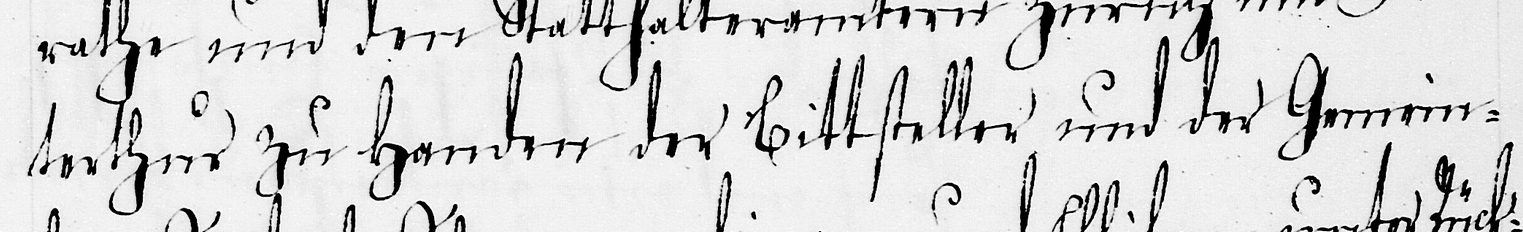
terthur zu Handen der Bittsteller und der Gemein¬
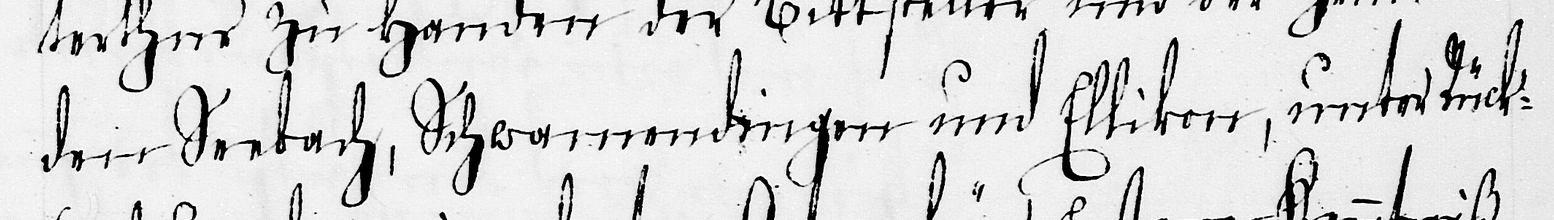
den Seebach, Schwamendingen und Ellikon, unter Rück¬
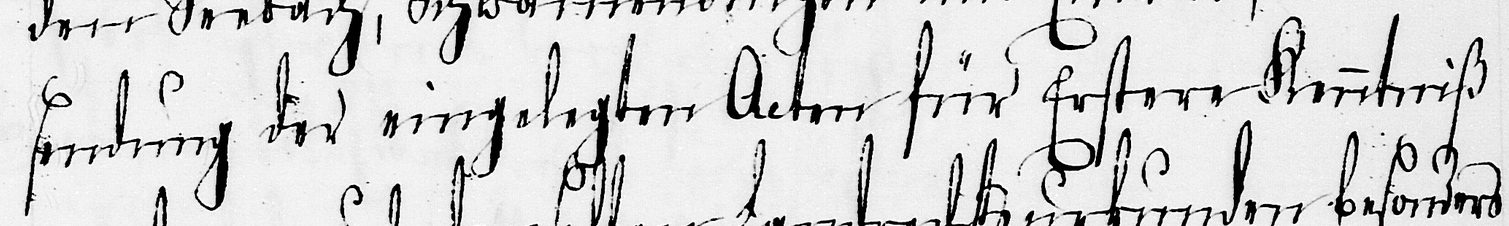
sendung der eingelegten Acten für Erstere Kenntniß
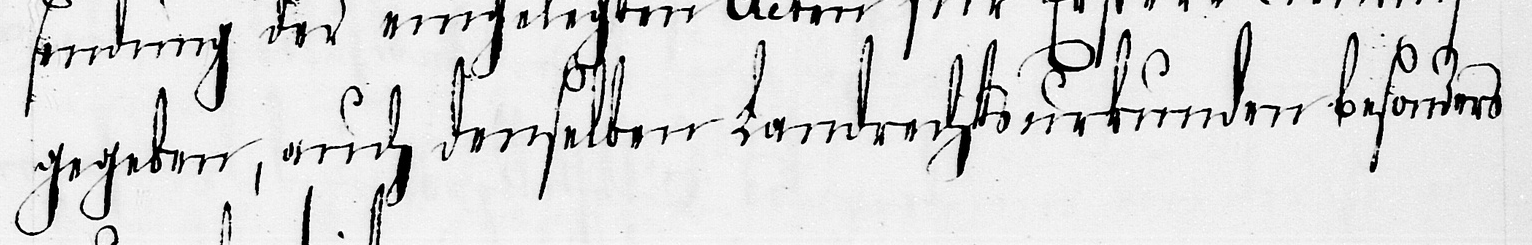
gegeben, auch denselben Landrechtsurkunden besonders
